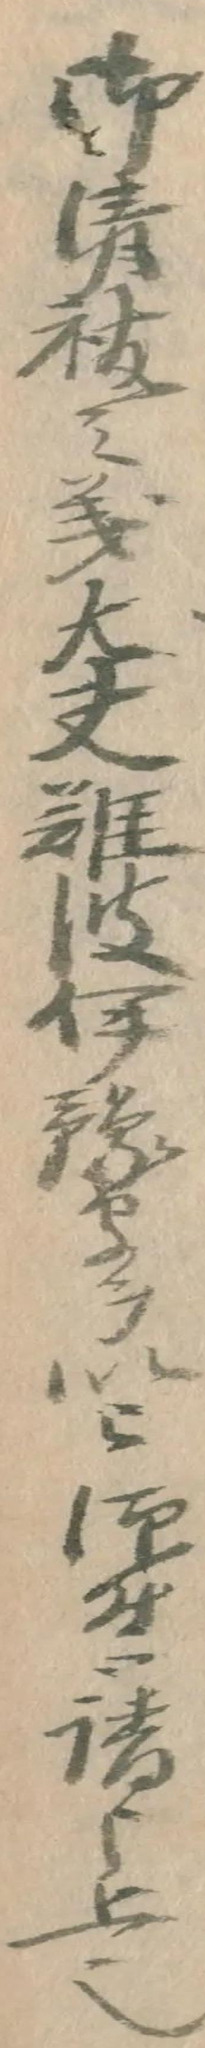御清祓之義大夫難波伊豫守ヲ以被仰付御請申上也

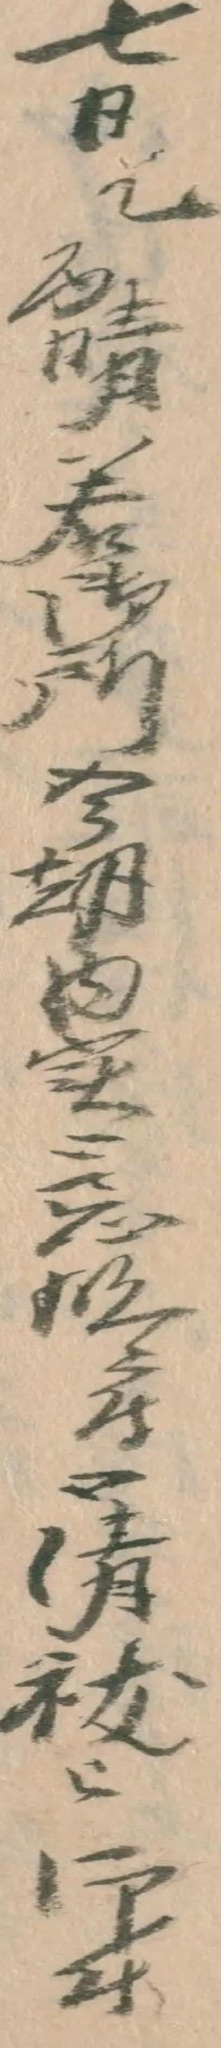七日乙酉晴若御所今朝内実御忌段ニ付御清祓被仰付
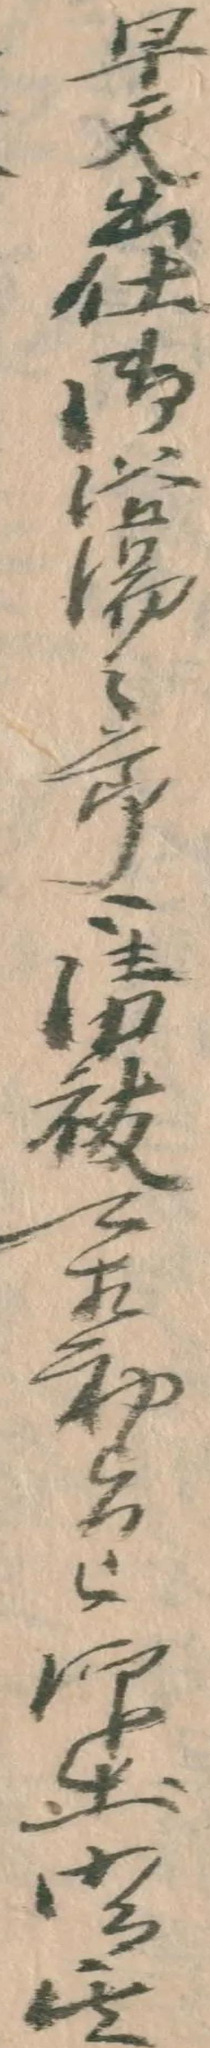早天出仕御浴場之節御清祓可相勤旨被仰出仍而其
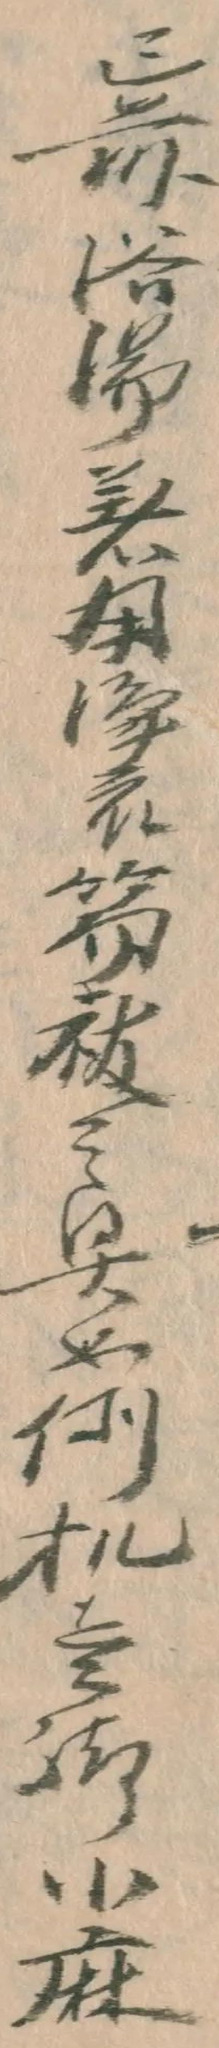已前浴湯着用浄衣笏祓之具如例机壱脚小麻
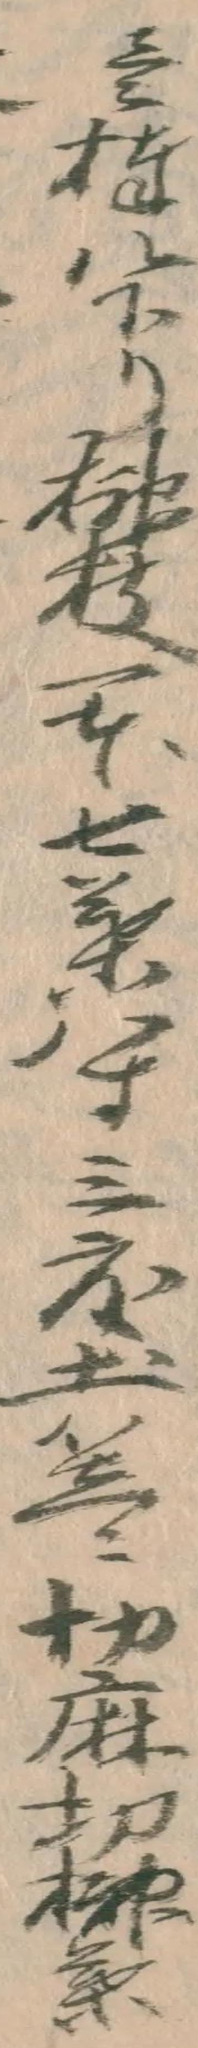壱棒八下り榊枝一本七葉八寸三度土器ニ切麻切椒葉
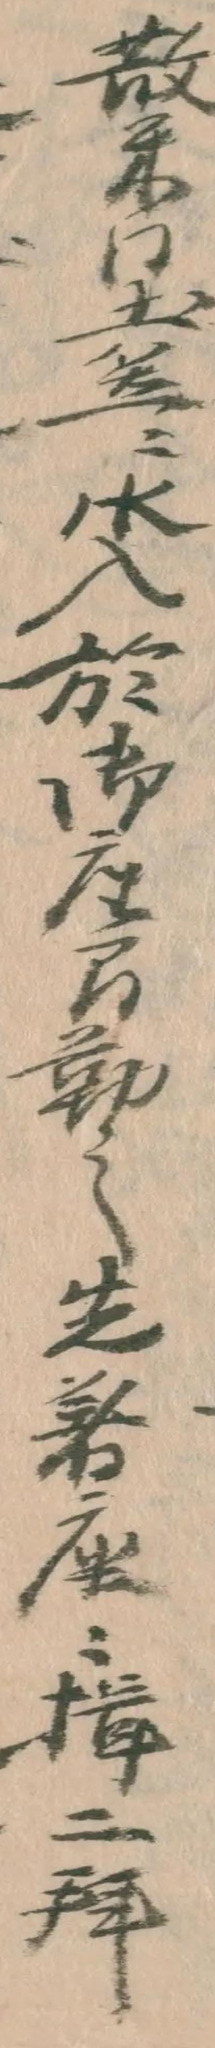散米同土器ニ水入於御座間勤之先着座々揖二拝
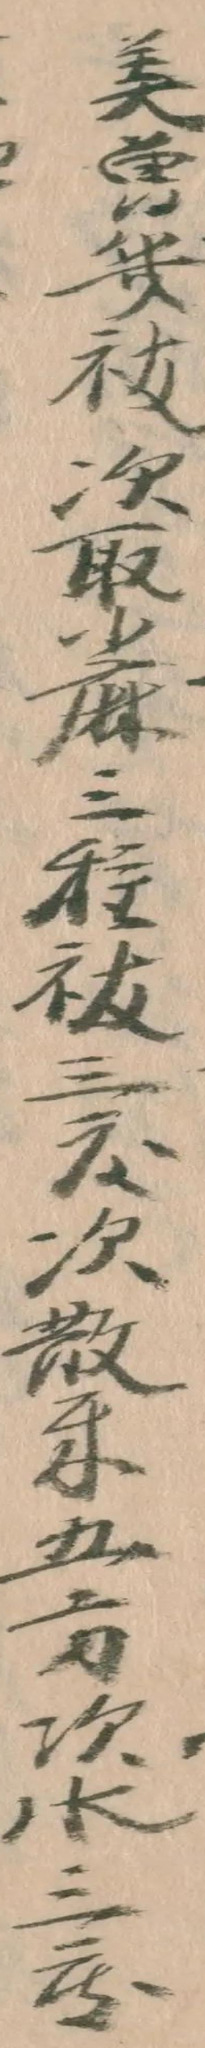美曽幾祓次取小麻三種秡三度次散米五方次水三度
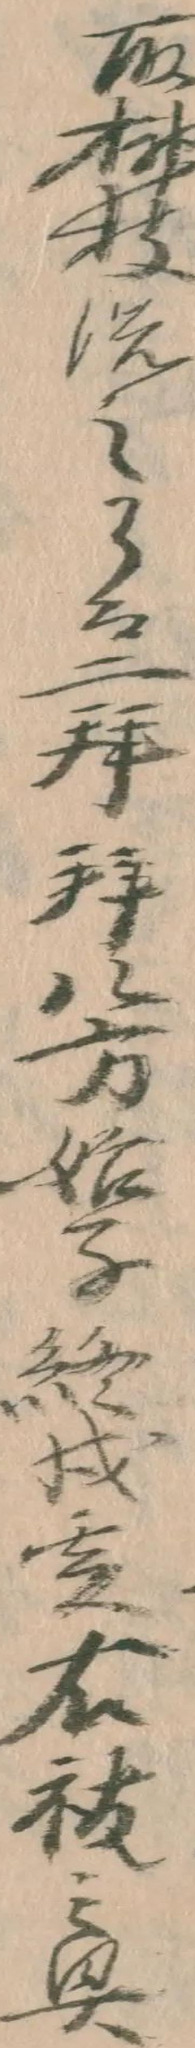取榊枝洗之了而二拝拝八方始子終戌亥右祓之具
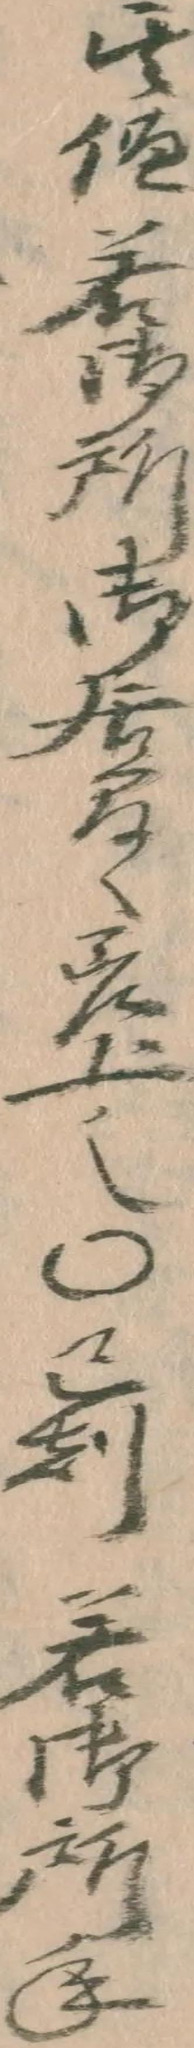其侭若御所御居間へ差上也〇巳刻若御所年
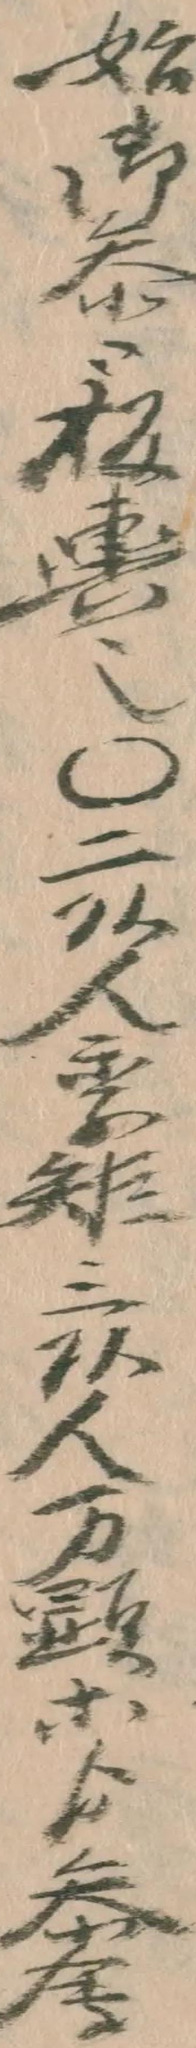始御参御板輿也○二頭人季矩三頭人万顕等ゟ参會
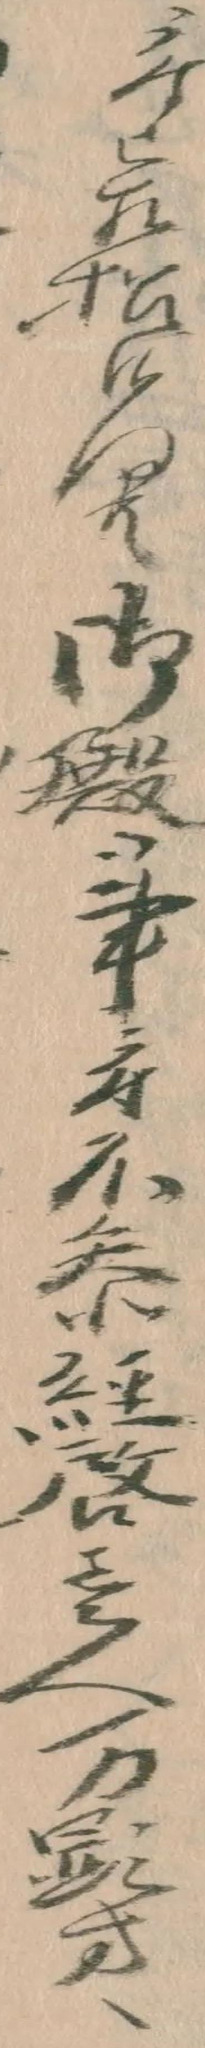ニ付被相招候得共御殿御事ニ付不参経啓壱人万顕方へ
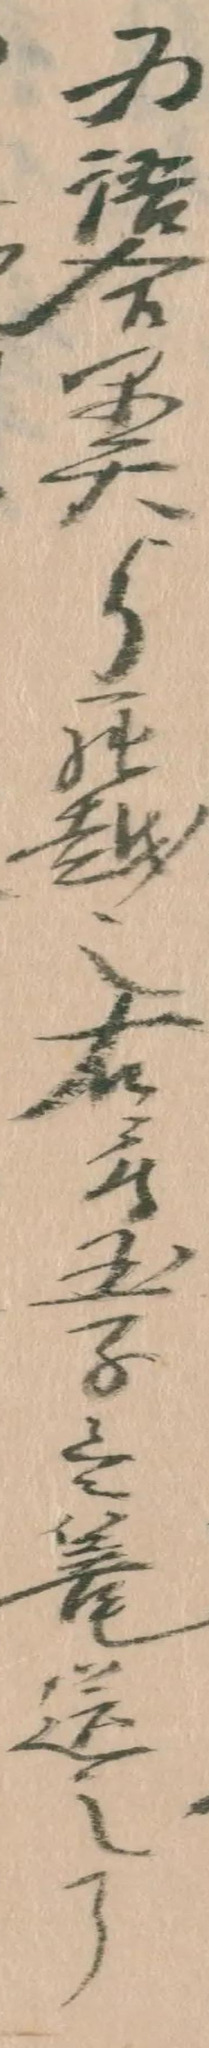為詰合早天より罷越也右ニ付玉子壱篭送之了
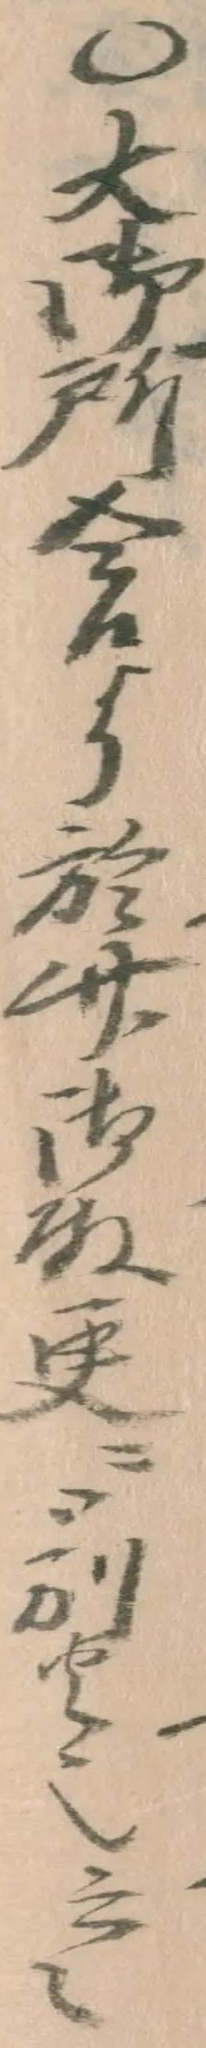○大御所今日より於弁御殿更ニ御別火也云々
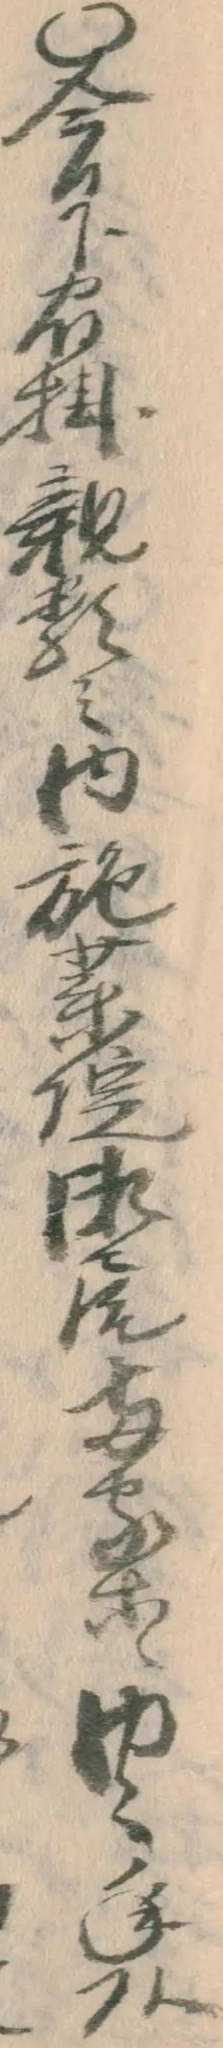○今日下宿掛親類之内施業院瀬尾両家等へ内々年頭
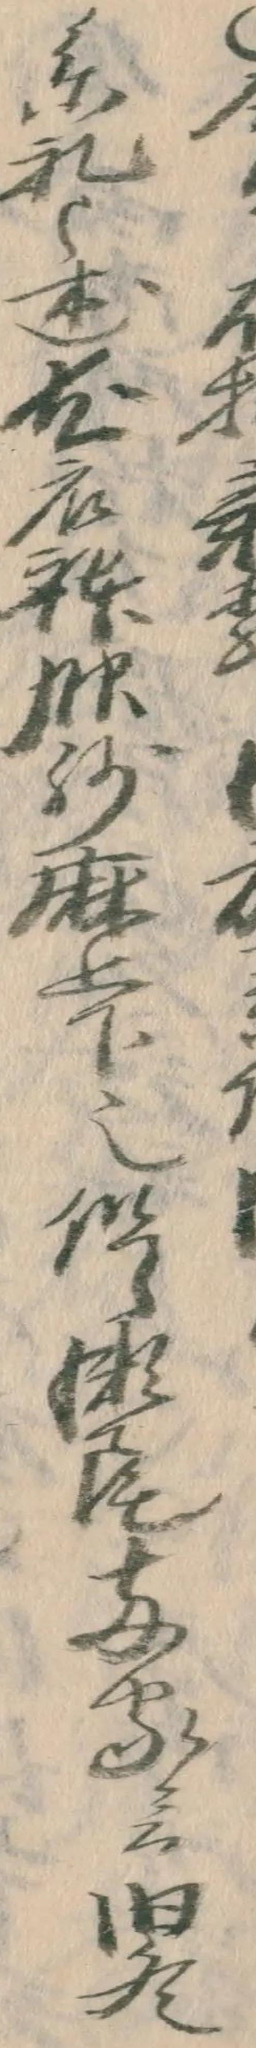参礼申述尤衣躰服紗麻上下也但し瀬尾両家ニ而旧冬
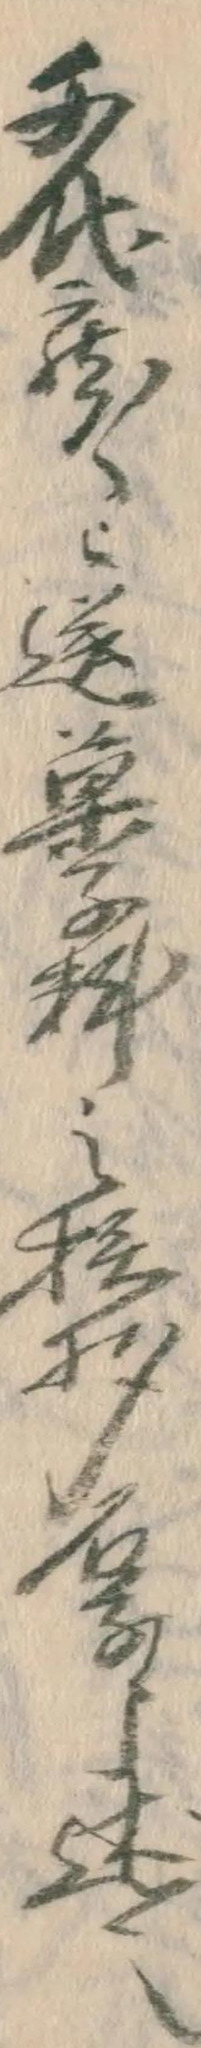千代蔵へ被送菓子料之挨拶厚申述也
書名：賀茂社記録. 第67冊
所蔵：国立国会図書館 National Diet Library, JAPAN
